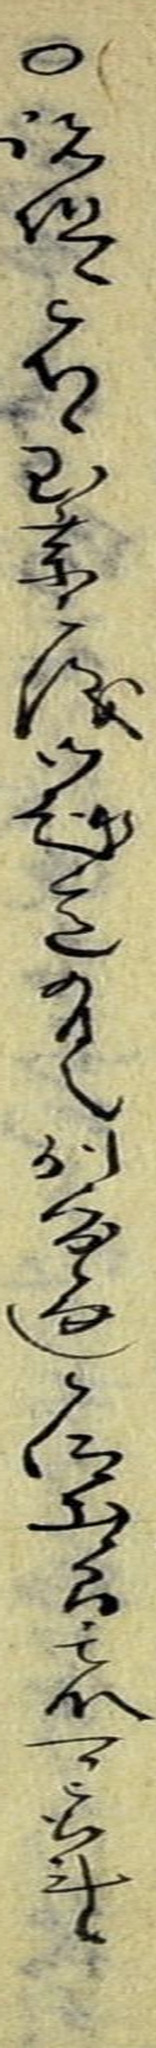○諸組へ被下候玉薬之儀御趣意有之別紙之通被仰出候間其段可被取斗候
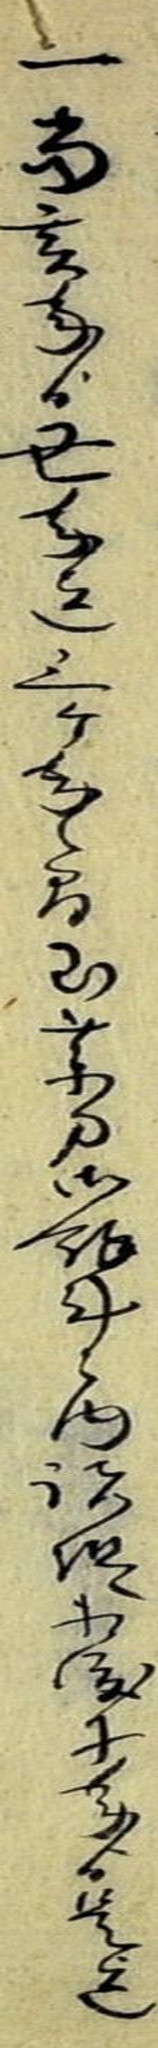一当亥年ゟ丑年迄三ヶ年之間玉薬方御餘計之内諸組へ相渡子年ゟ是迄
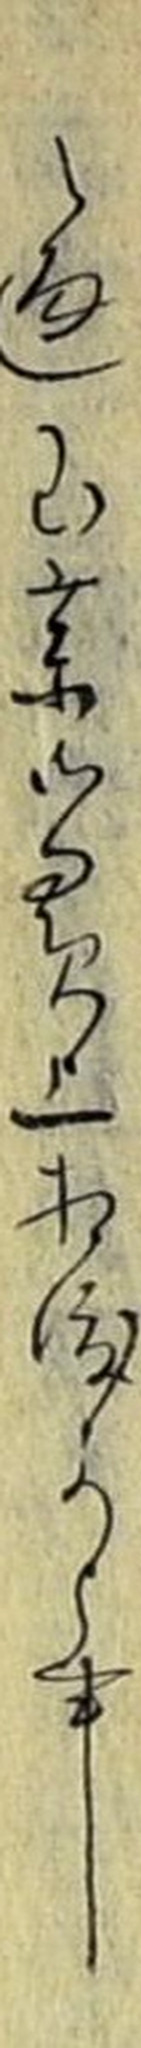之通玉薬御買上相渡可申事
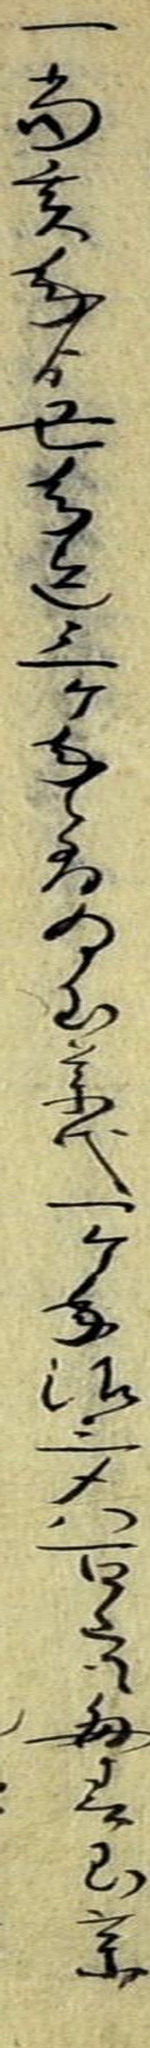一当亥年ゟ丑年迄三ヶ年之間為玉薬代一ヶ年銀三貫八百匁つヽ毎年玉薬
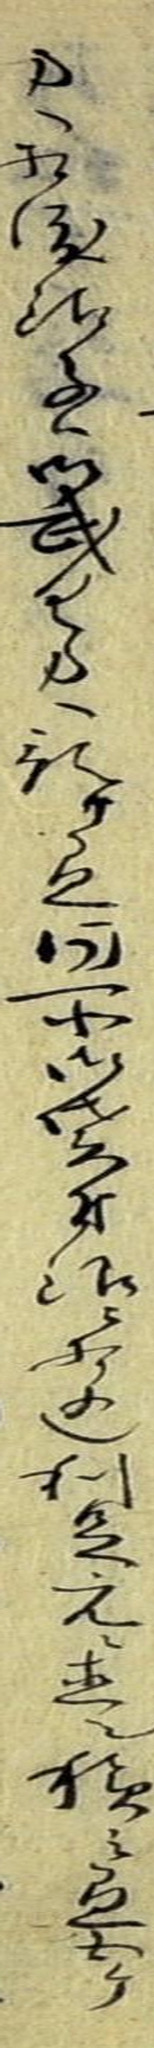方へ相渡銀子は御武具方へ預ヶ置同所御貸付銀に打込利足元に直し積に置五ヶ
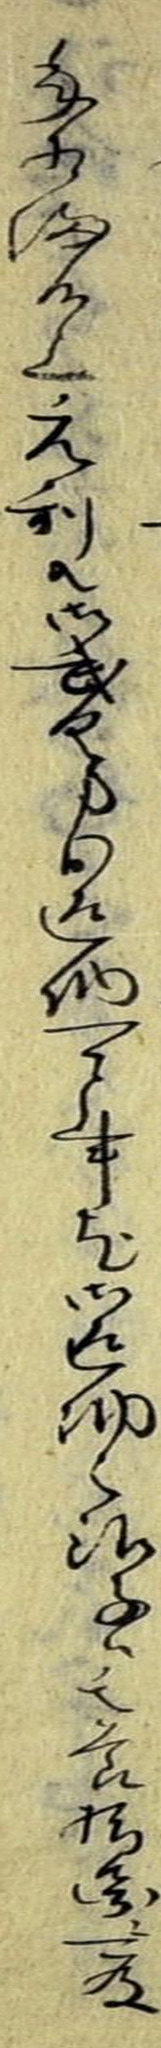年相満候上元利共御武具方ゟ返納可申事尤御返納之銀子は其節指図に可及
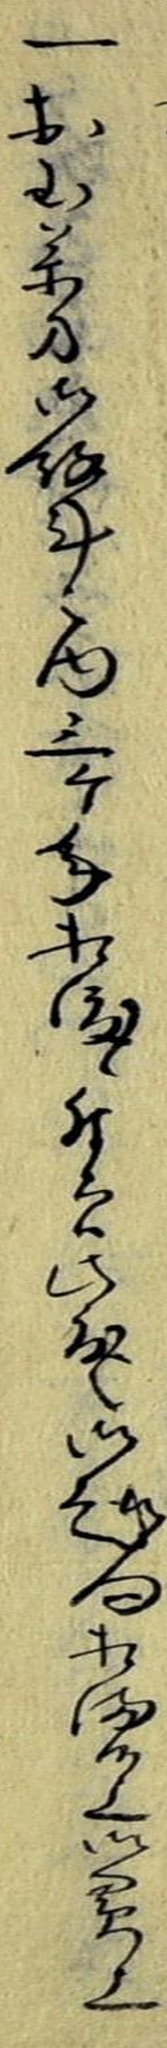一於玉薬方御餘計之内三ヶ年相渡候付而は此度之御趣向相満候上御買上

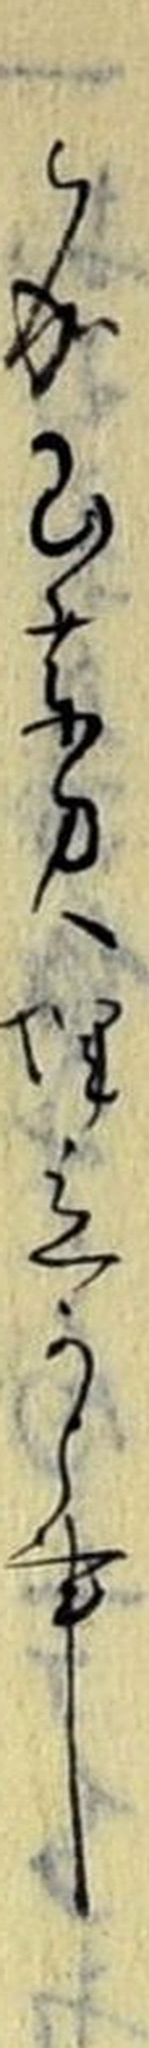被成玉薬方へ埋立可申事
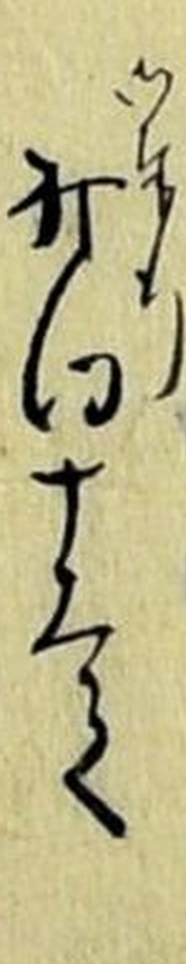村田十太夫
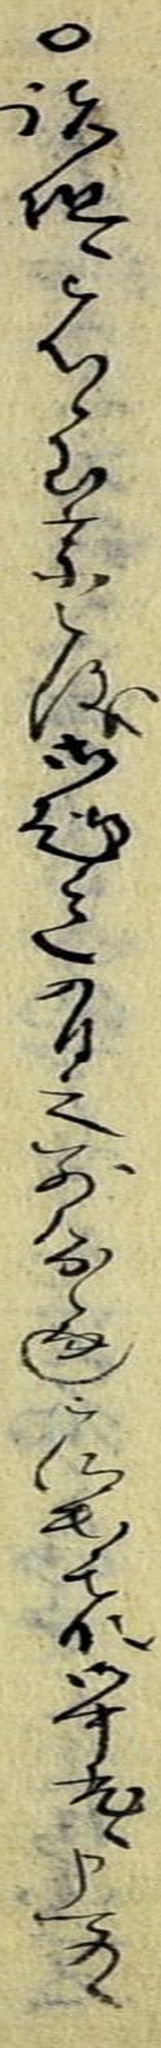○諸組へ被下候玉薬之儀御趣意有之別紙之通被仰出其段御中老へ申聞候
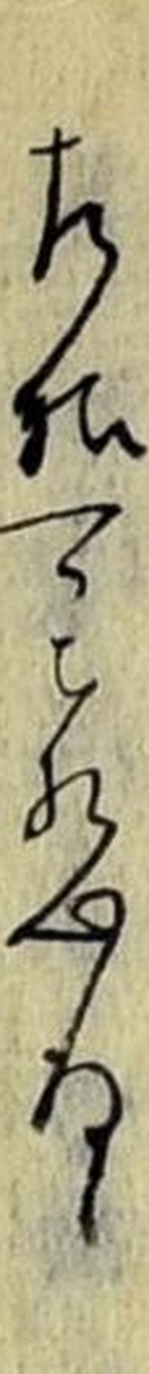左様可被相心得候
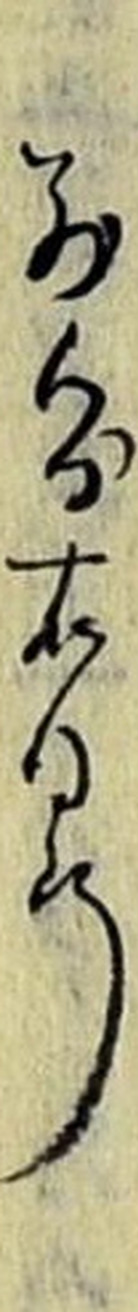別紙右同断
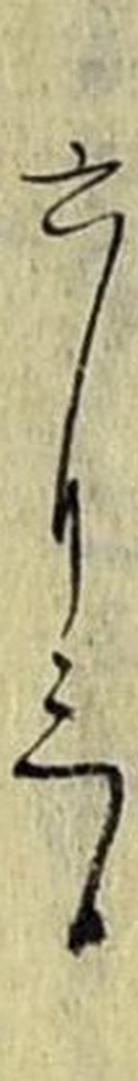六月三日
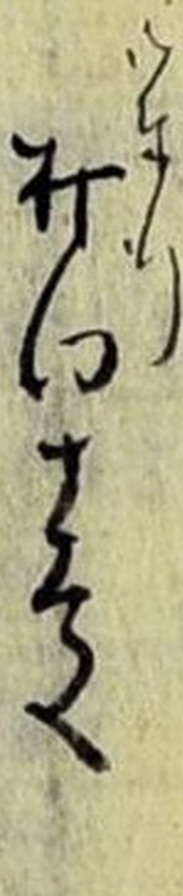村田十太夫
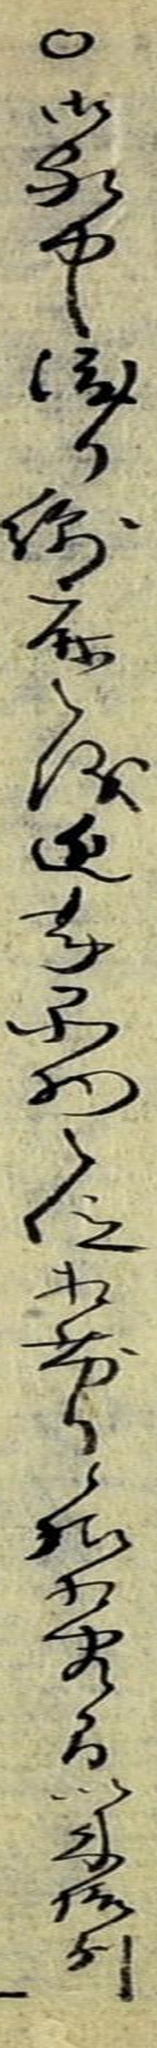○御家中渡り綿麻之儀近年品物之位相劣り候様相聞候間以来格別
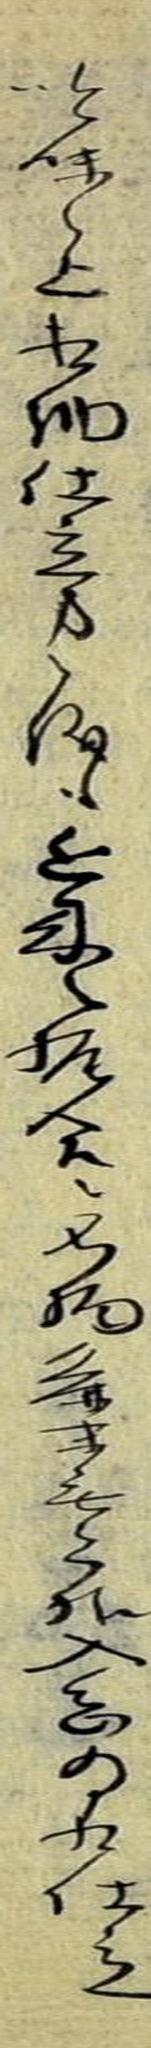吟味之上相納仕立方之儀も近来之振合に不拘麁末無之様入念相仕立
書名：命令之部 四
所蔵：福井県文書館 Fukui Prefectural Archives
